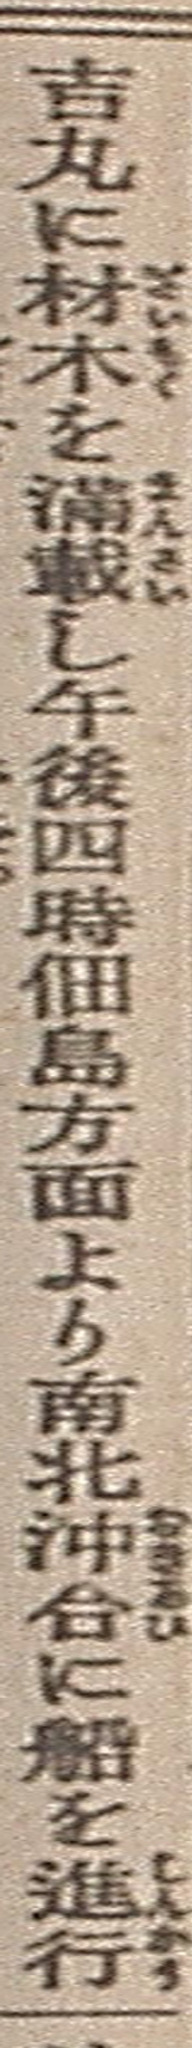吉丸に材木を満載し午後四時佃島方面より南北沖合に船を進行
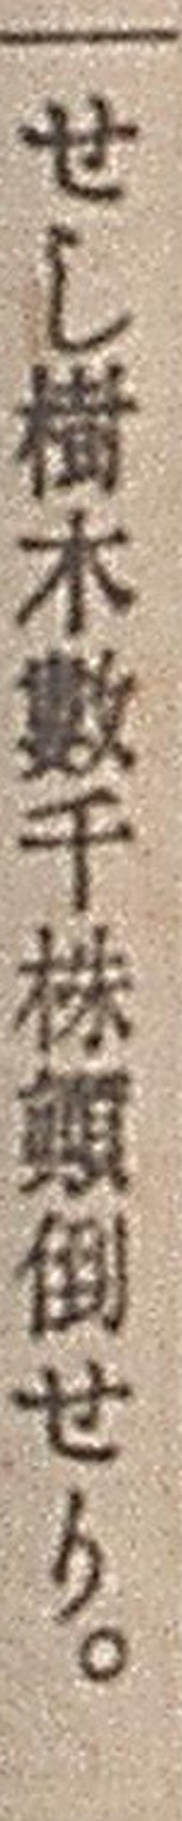せし樹木数千株顛倒せり。
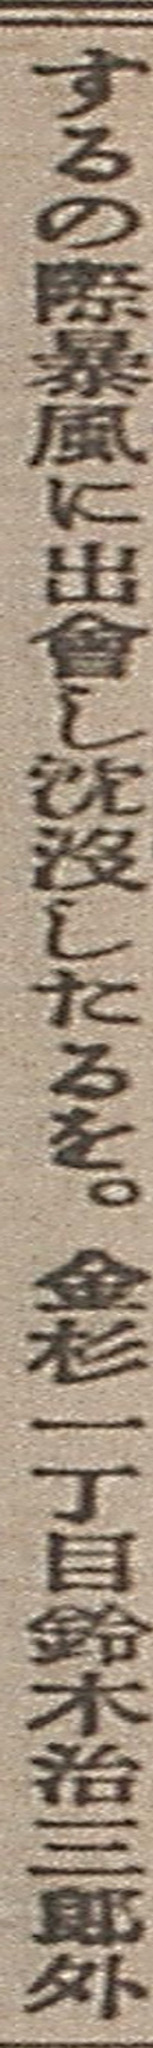するの際暴風に出会し沈没したるを。金杉一丁目鈴木治三郎外
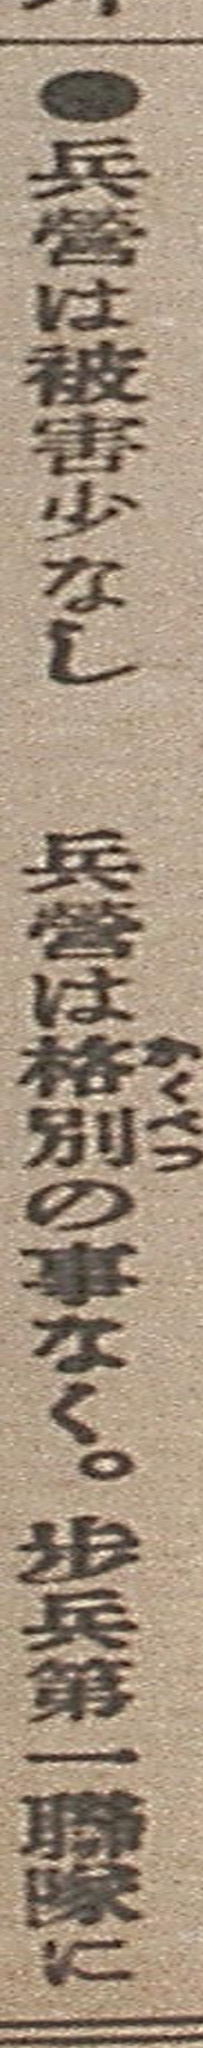●兵営は被害少なし。兵営は格別の事なく。歩兵第一連隊に
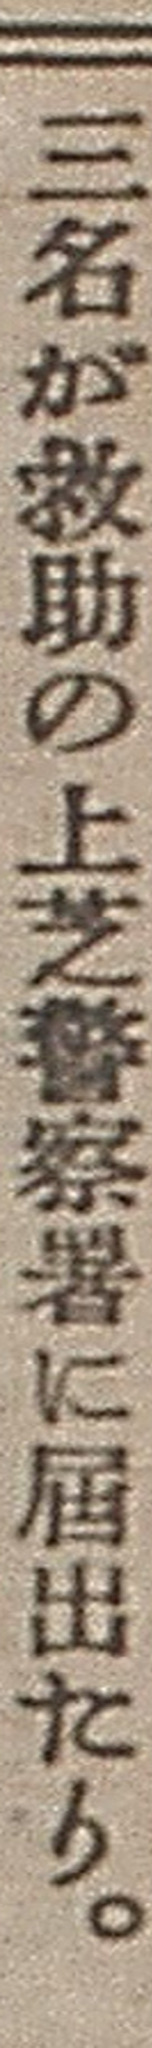三名が救助の上芝警察署に届出たり。
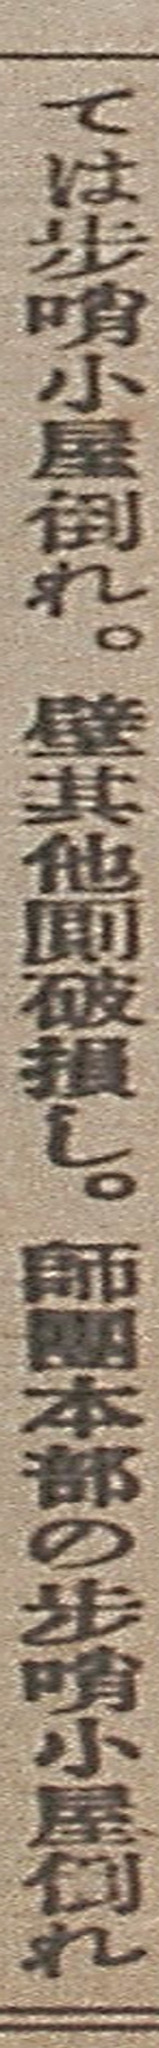ては歩哨小屋倒れ。壁其他厠破損し。師団本部の歩哨小屋倒れ
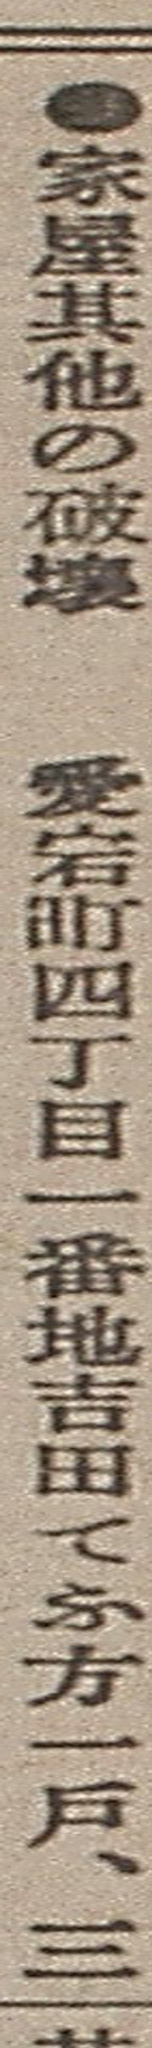●家屋其他の破壊愛宕町四丁目一番地吉田てふ方一戸、三
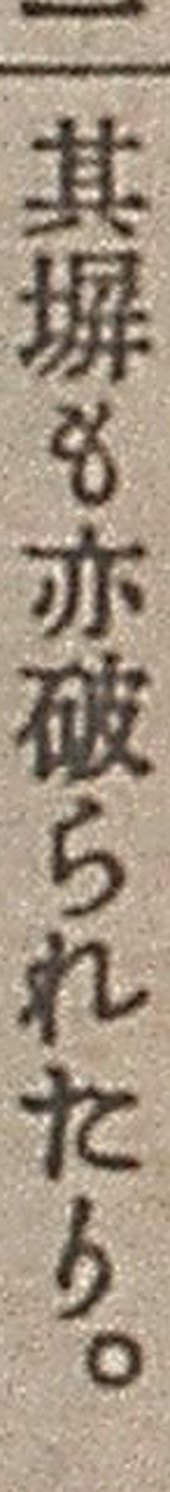其塀も亦破られたり。
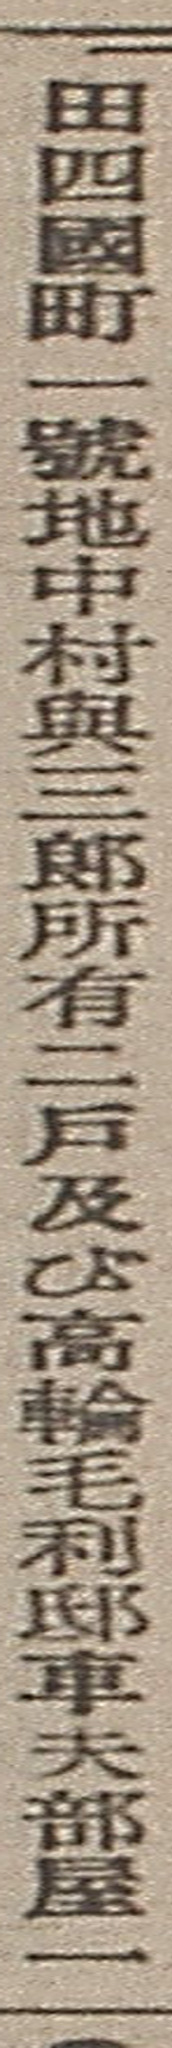田四国町一号地中村與三郎所有二戸及び高輪毛利邸車夫部屋一
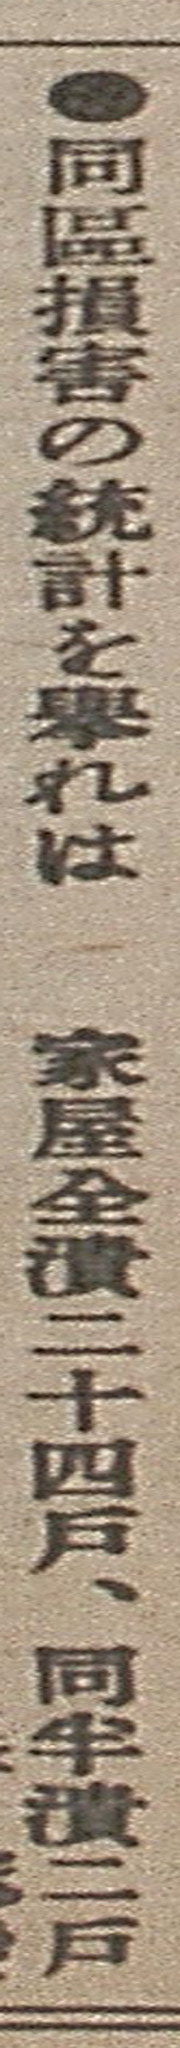●同区損害の統計を挙れは家屋全潰二十四戸、同半潰二戸
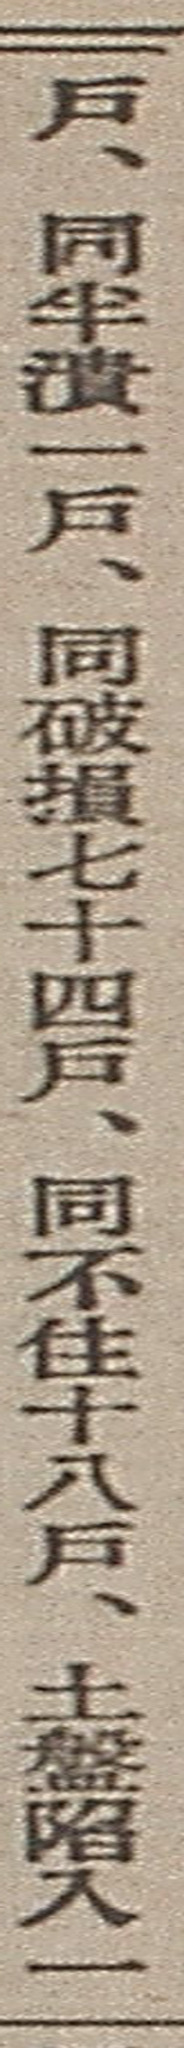戸、同半潰一戸、同破損七十四戸、同不住十八戸、土盤陥入一
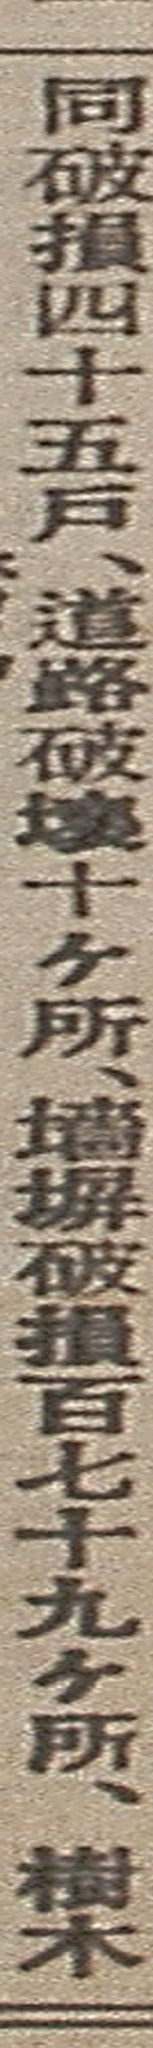同破損四十五戸、道路破壊十ケ所、墻塀破損百七十九ケ所、樹木
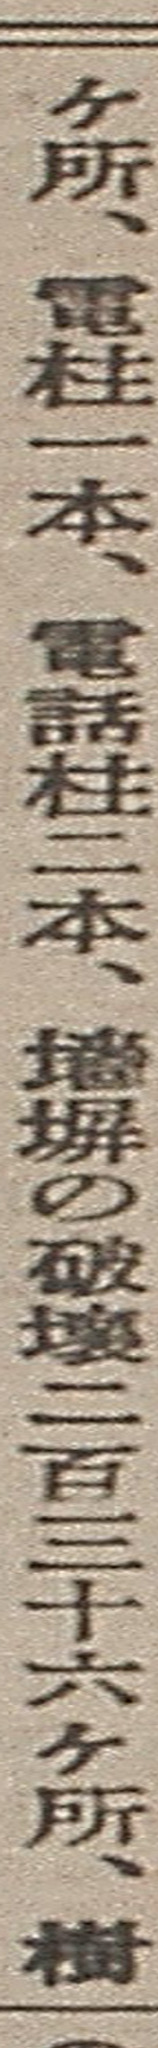ケ所、電柱一本、電話柱二本、墻塀の破壊二百三十六ケ所、樹
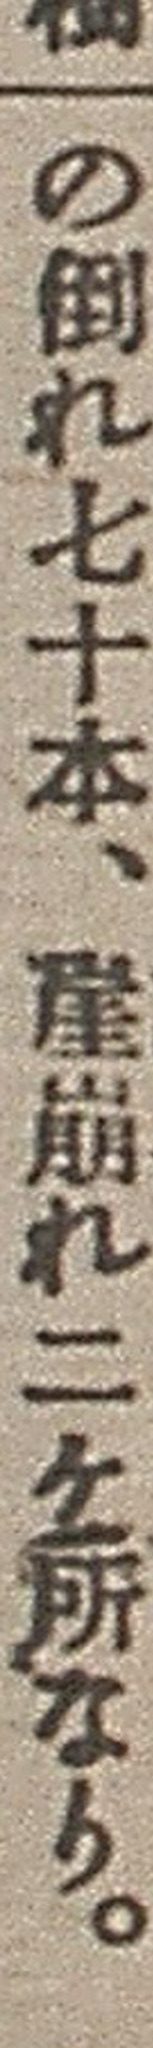の倒れ七十本、崖崩れ二ケ所なり。
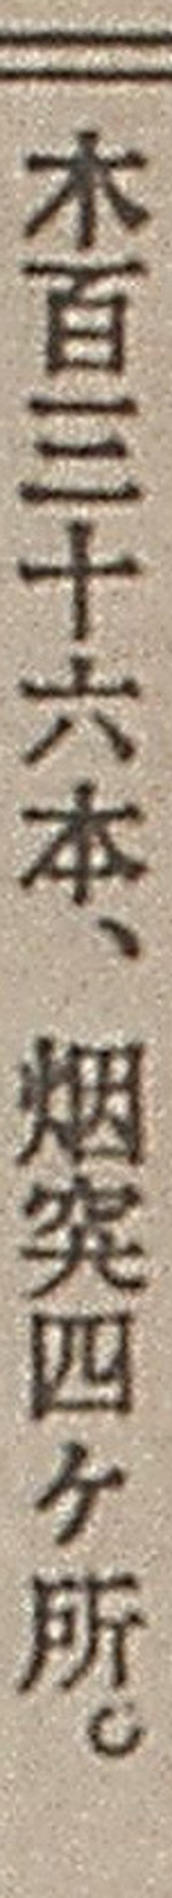木百三十六本、烟突四ケ所。
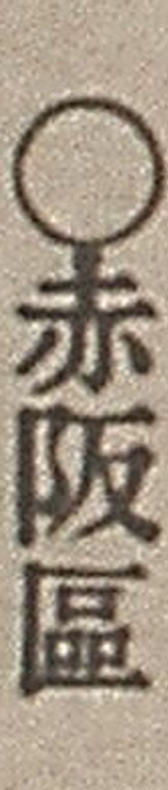〇赤阪区
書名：風俗畫報臨時増刊第百九十九號　明治三十二年十月各地災害圖會（前編之續）
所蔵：東京大学地震研究所図書室 Earthquake Research Institute Library, The University of Tokyo, JAPAN
